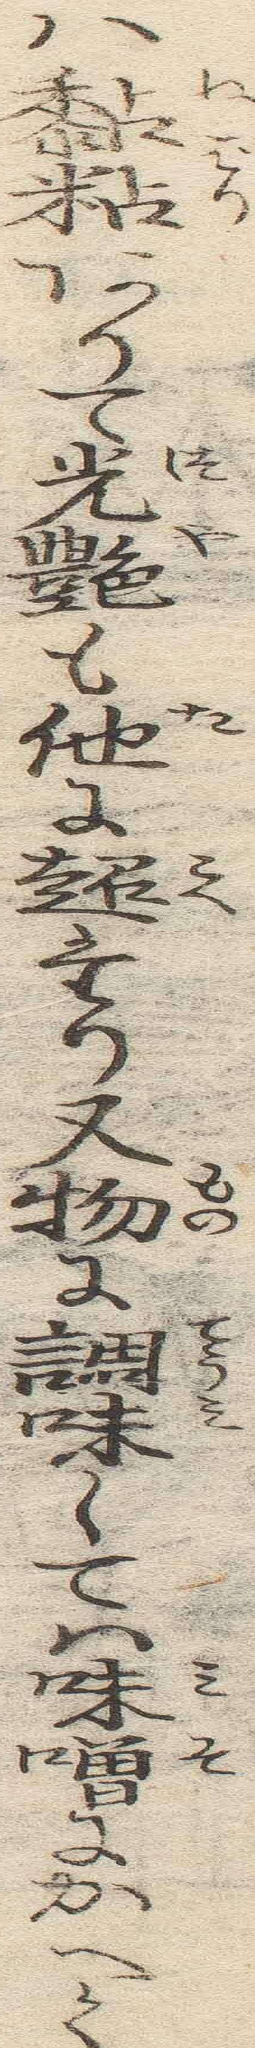は黏粘ありて光艶も他に超たり又物に調味しては味噌にかへて
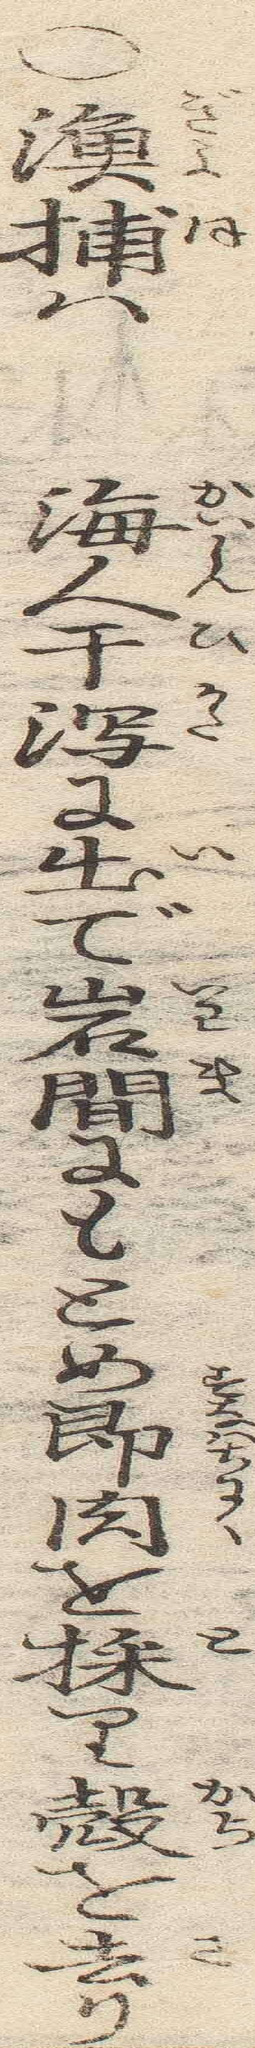○漁捕は海人干潟に出で岩間にもとめ即肉を採り殻を去り
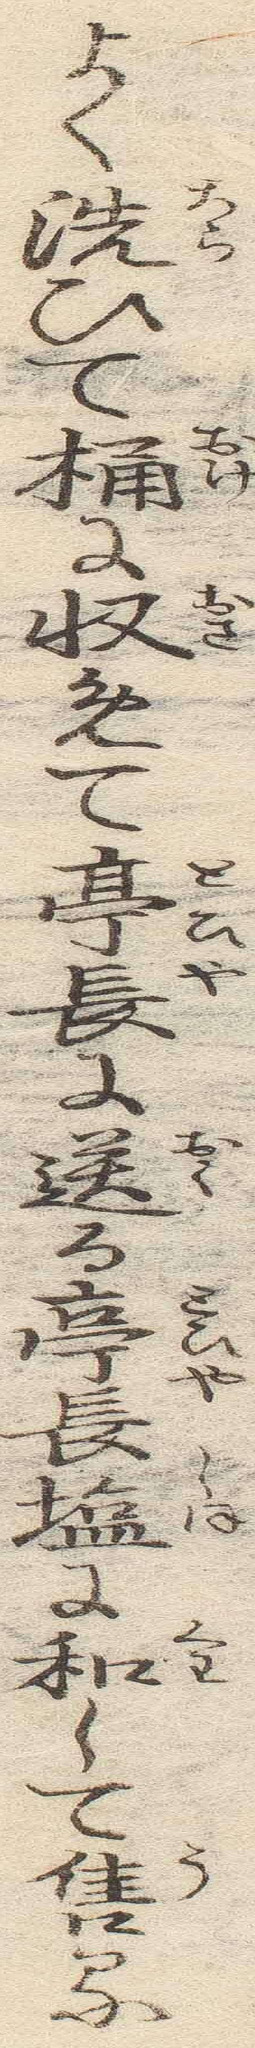よく洗ひて桶に収めて亭長に送る亭長塩に和して售る
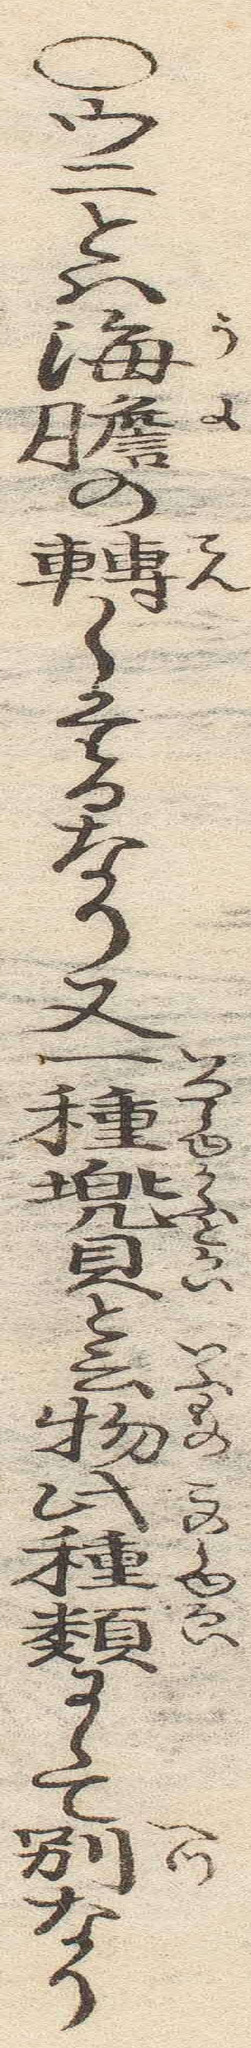○ウニとは海胆の転したるなり又一種兜貝と云物此種類にして別なり
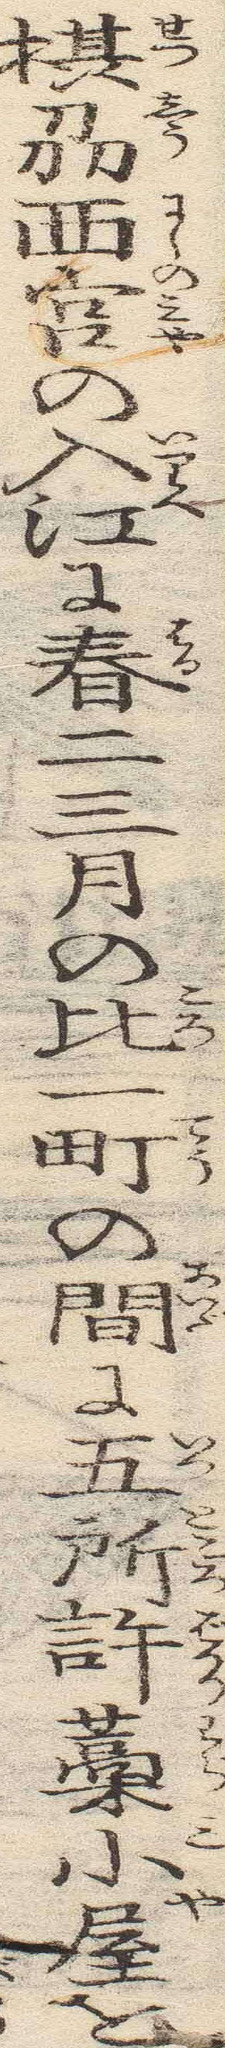摂州西宮の入江に春二三月の比一町の間に五所許藁小屋を
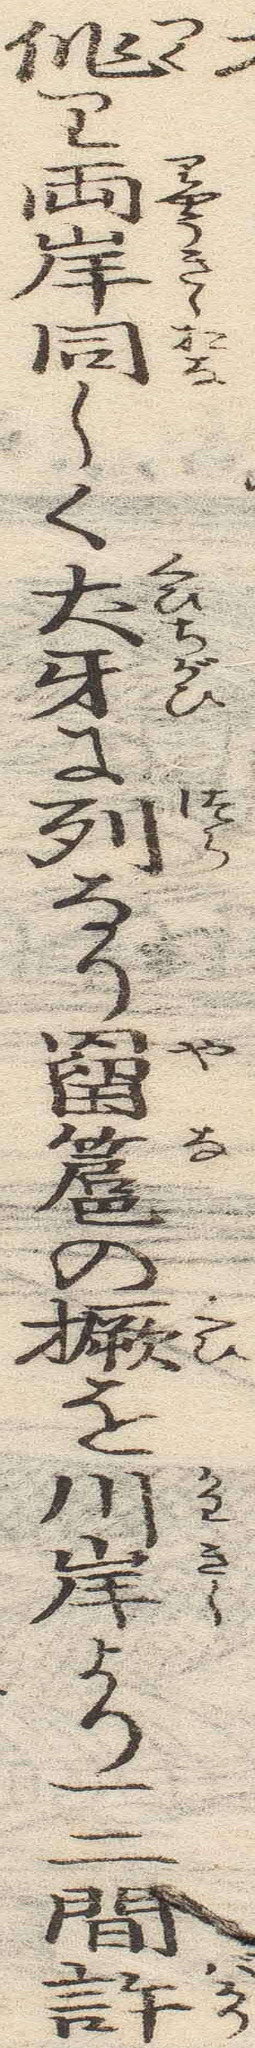作り両岸同しく犬牙に列なり罶簄の橛を川岸より一二間許
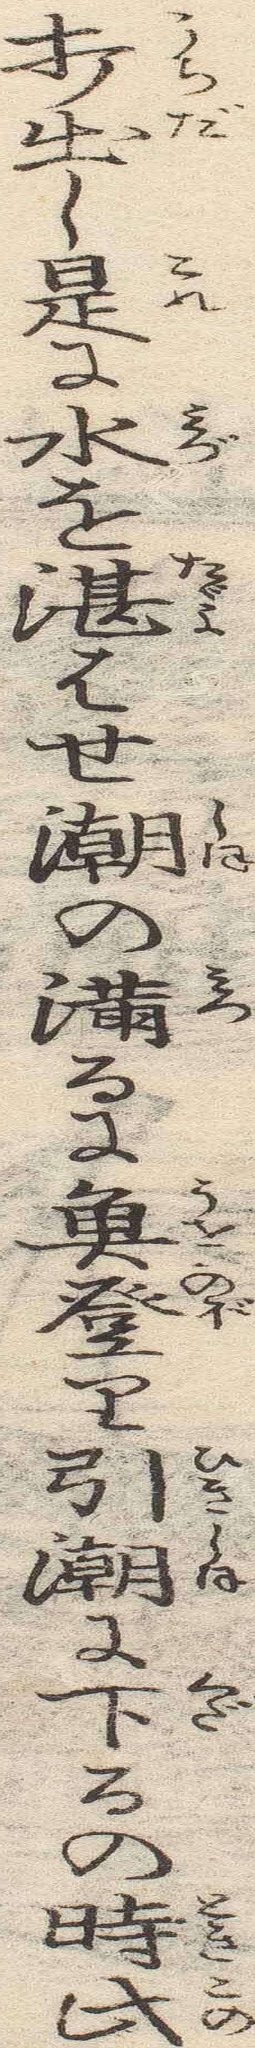打出し是に水を湛はせ潮の満るに魚登り引潮に下るの時此
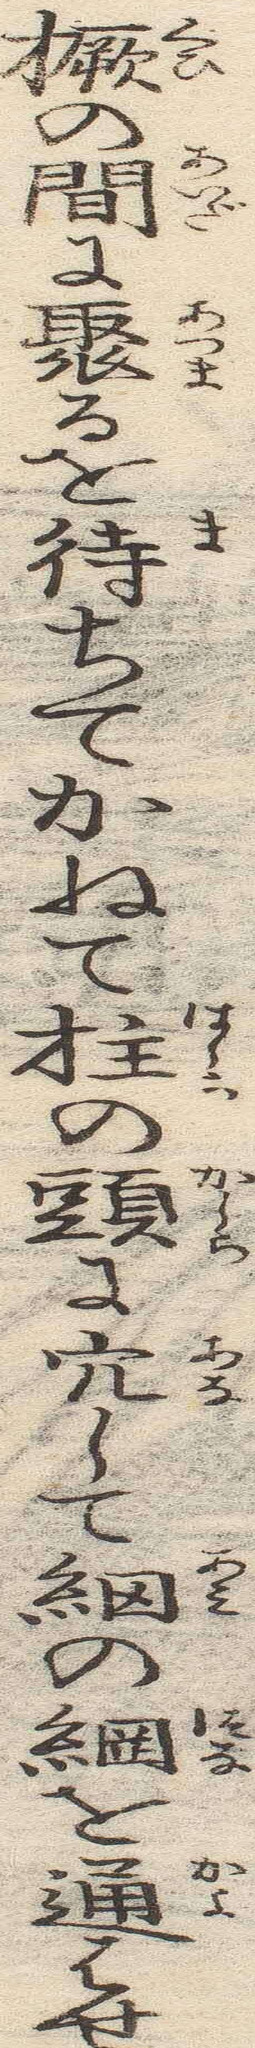橛の間に聚るを待ちてかねて柱の頭に穴して網の綱を通はせ
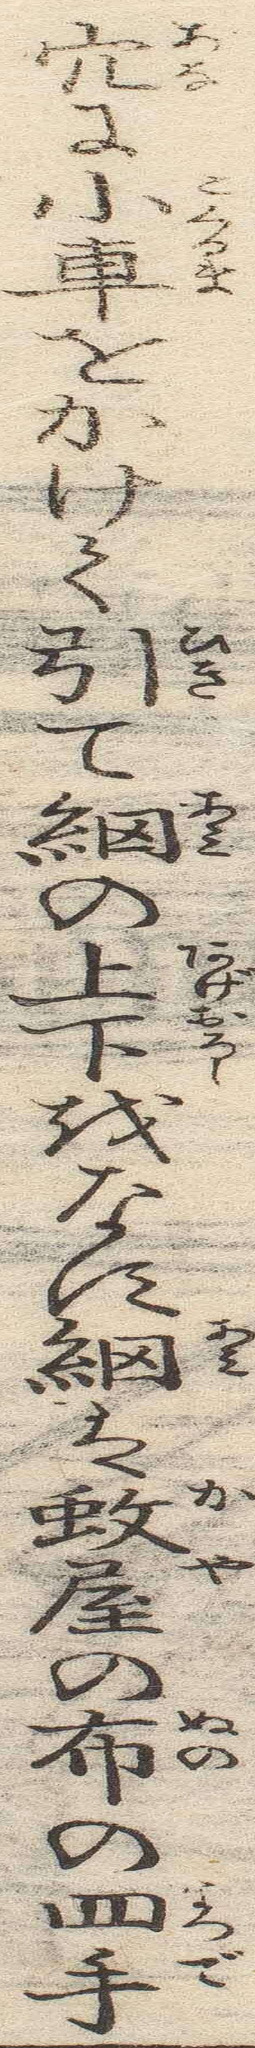穴に小車をかけて引て網の上下をなす網は蚊屋の布の四手
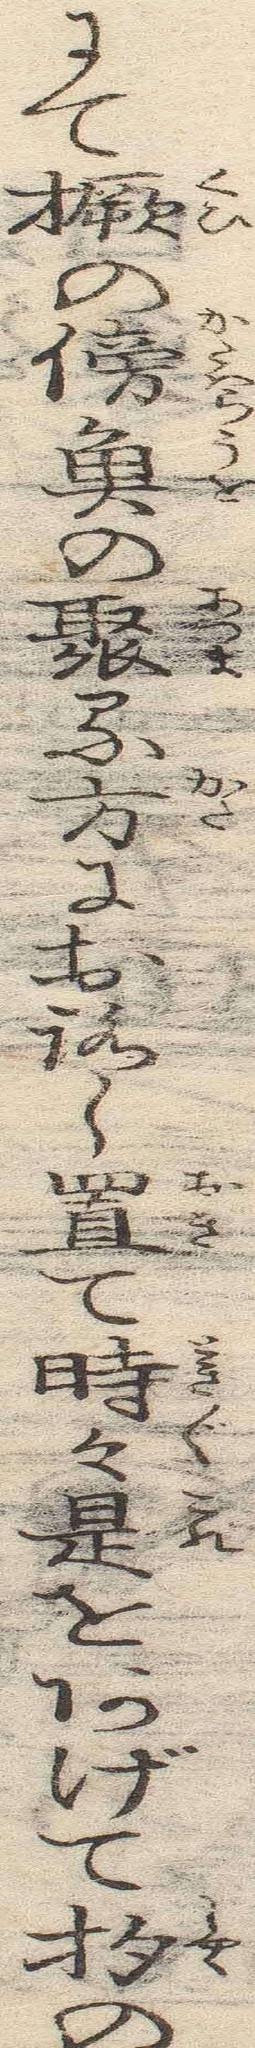にて橛の傍魚の聚る方におろし置て時々是をあげて杓の
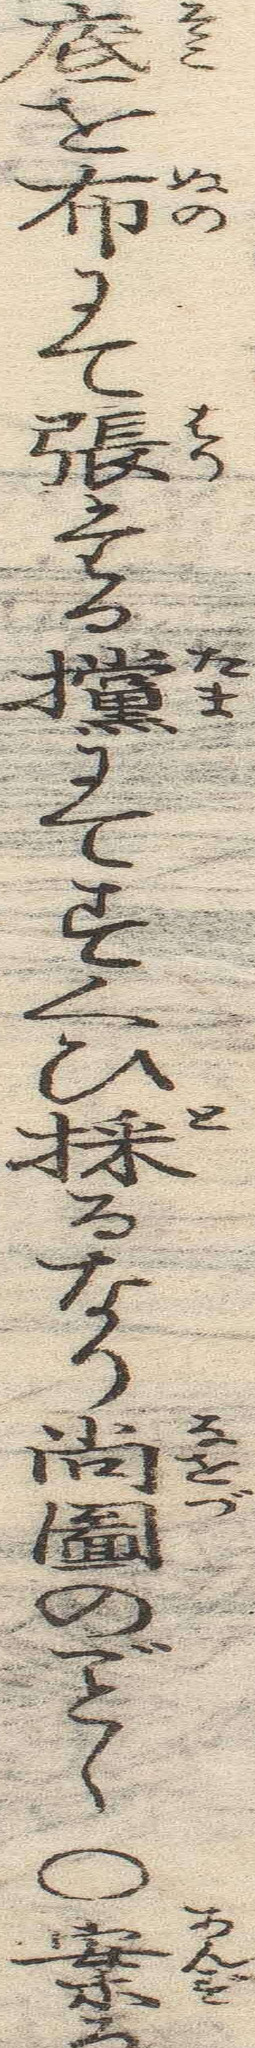底を布にて張たる攩にてすくひ採るなり尚図のごとし○案る
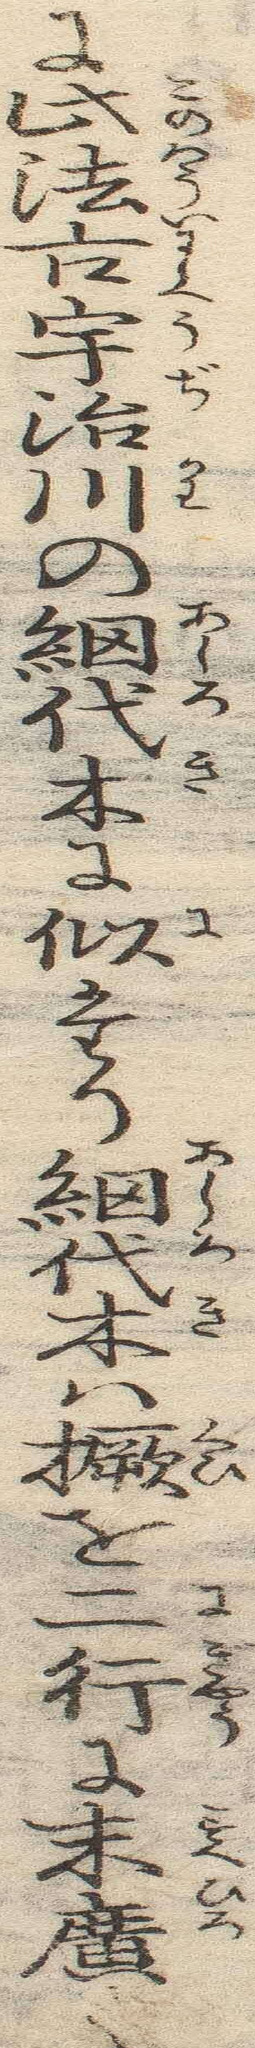に此法古宇治川の網代木に似たり網代木は橛を二行に末広く
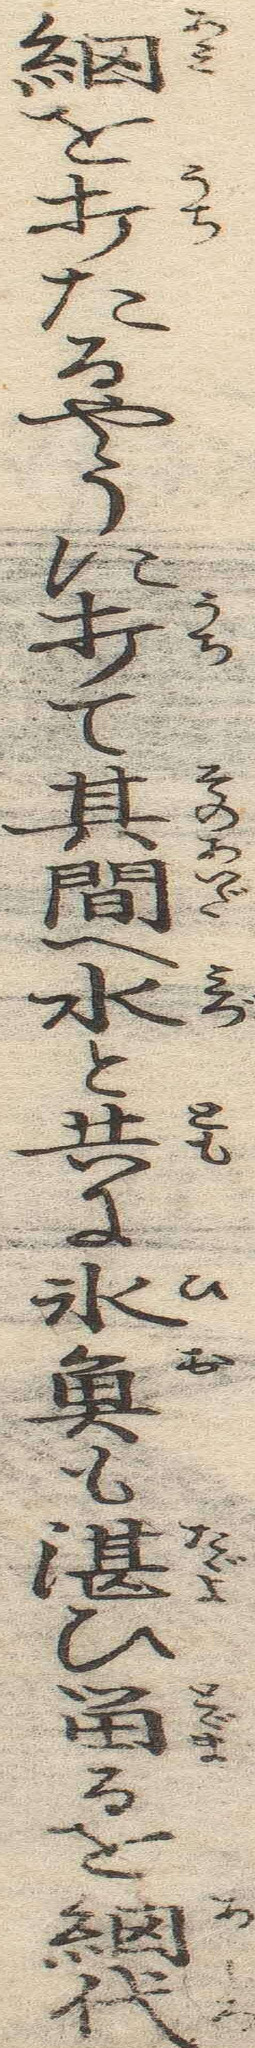網を打たるやうに打て其間へ水と共に氷魚も湛ひ留るを網代
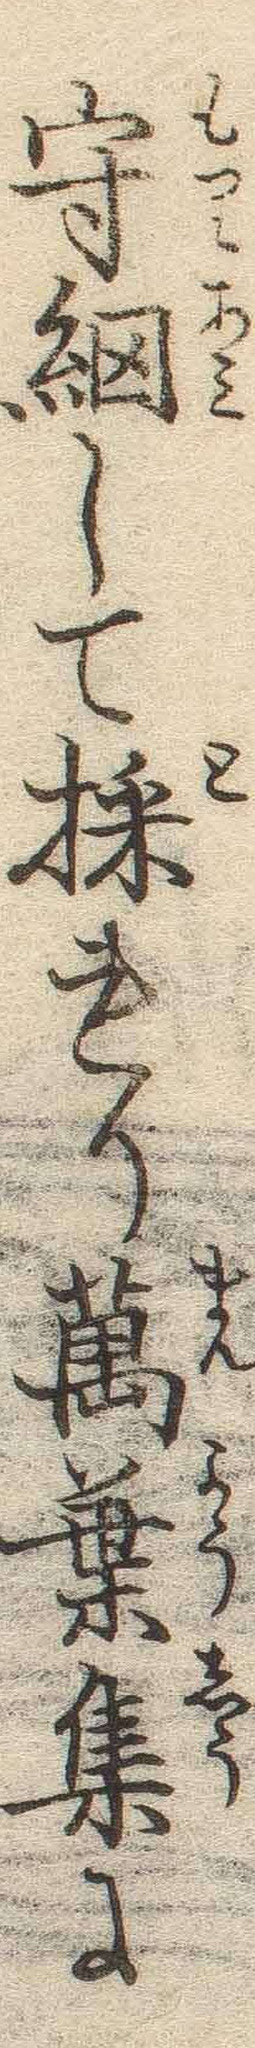守網して採れり万葉集に
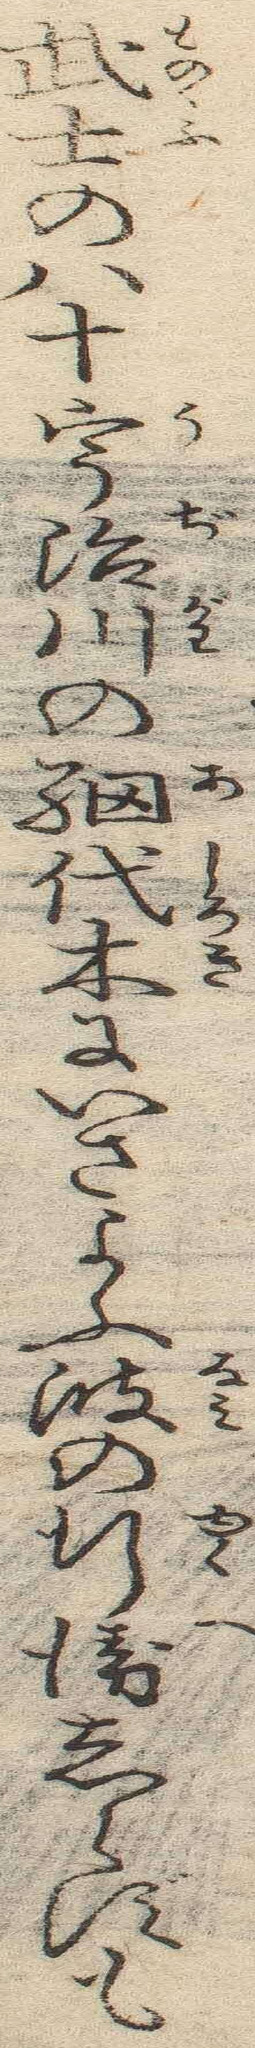武士は八十宇治川の網代木にいさよふ波の行衛しらずも
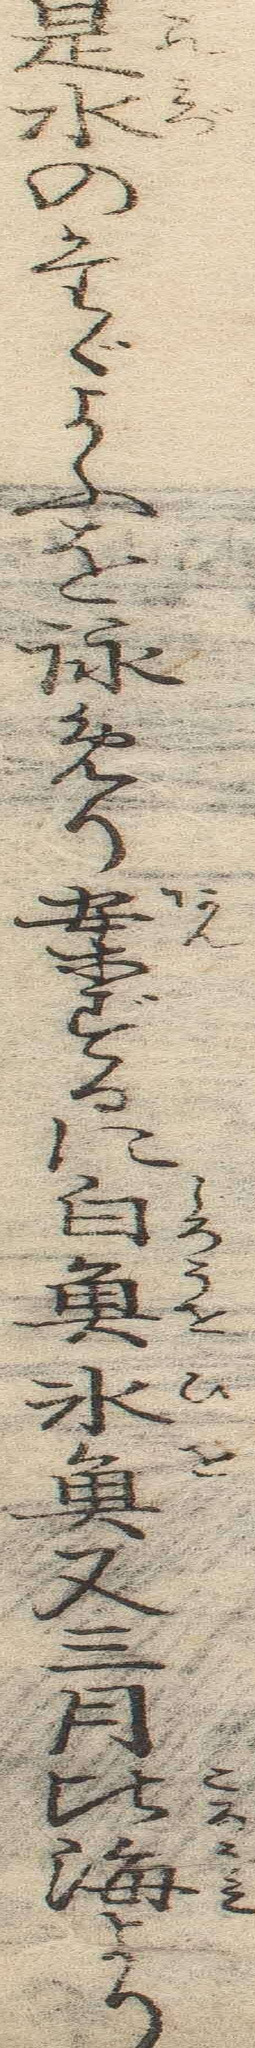是水のたゞよふを詠めり案ずるに白魚氷魚又三月此海より
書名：日本山海名産図会
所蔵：東京学芸大学附属図書館 国文学研究資料館
